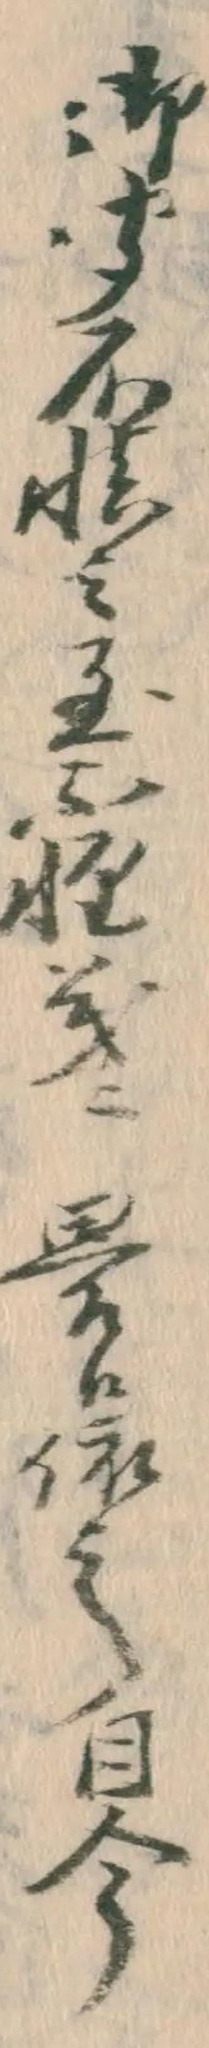御聞不慎之至不軽義ニ思召候依之自今
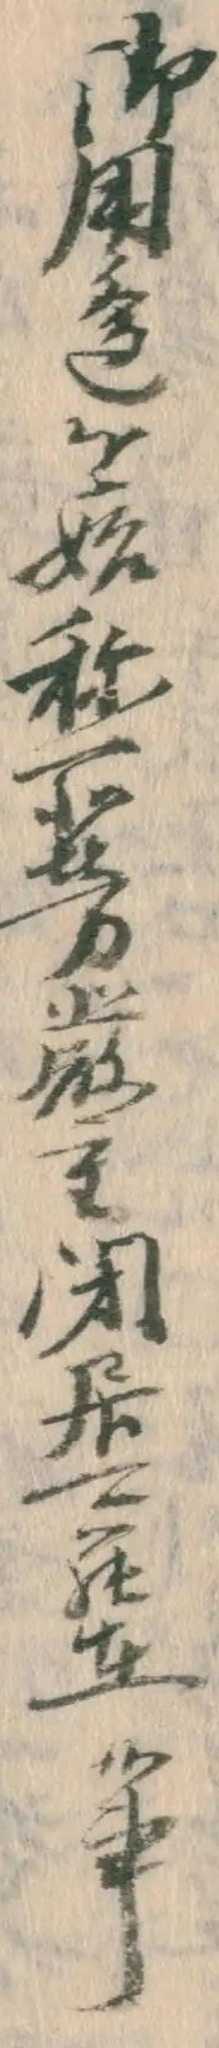御用邊を始称所労厳重閉居可罷在候事
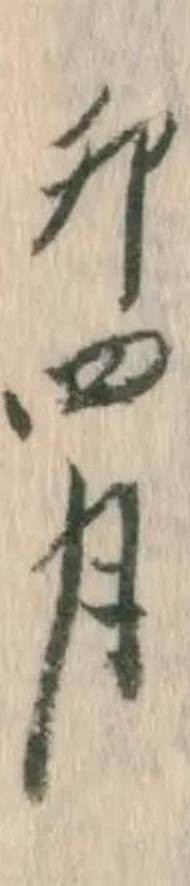卯四月
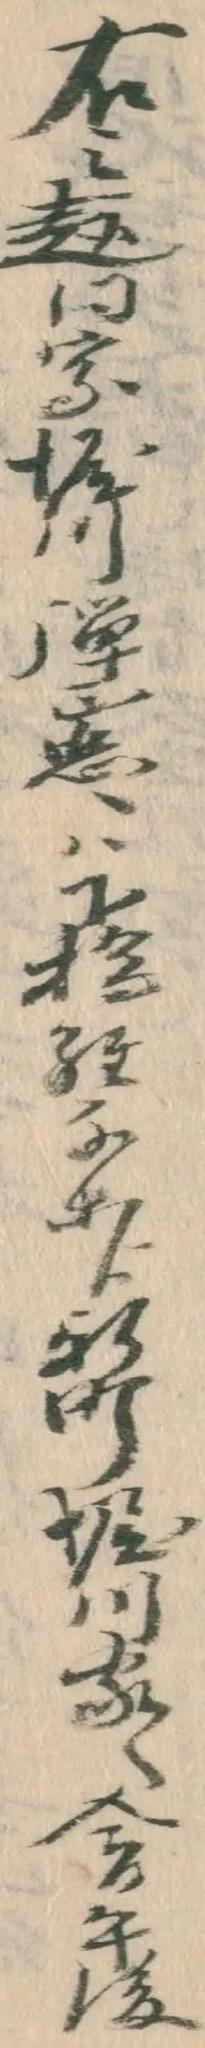右之趣同家堀川弾正志へハ下橋軽千等ゟ新町堀川家へ今日午後
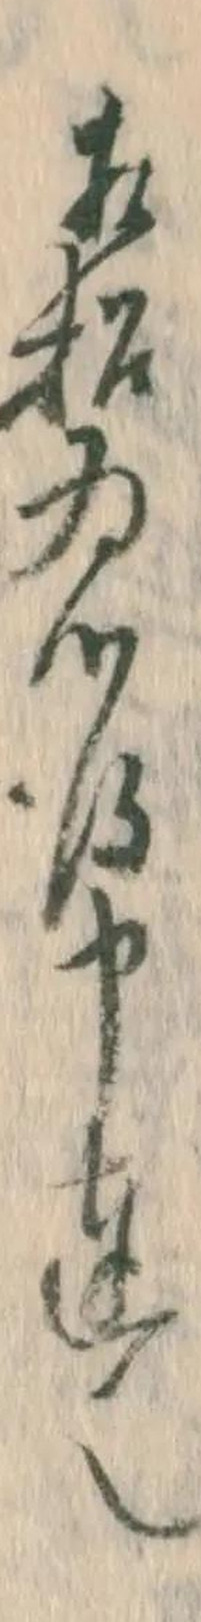相招為心得申達也
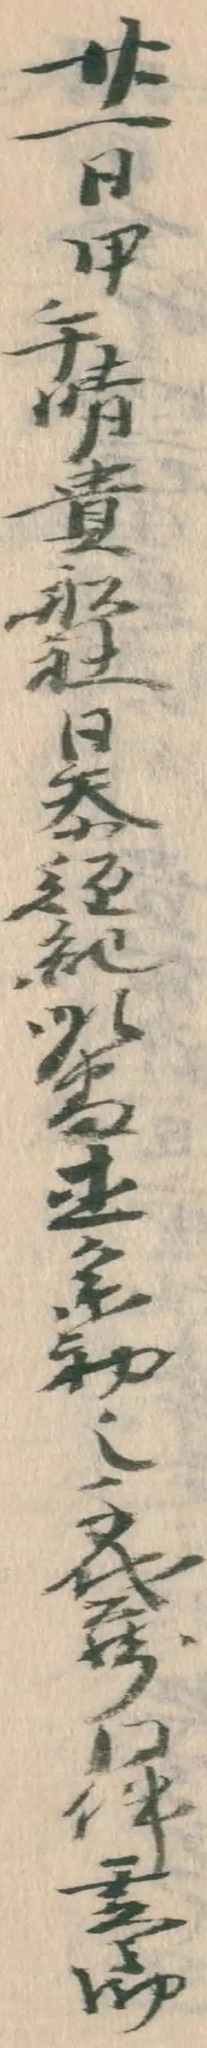廿一日甲午晴貴舩社日参経紀順番直参勤也千代蔵同伴玄之助
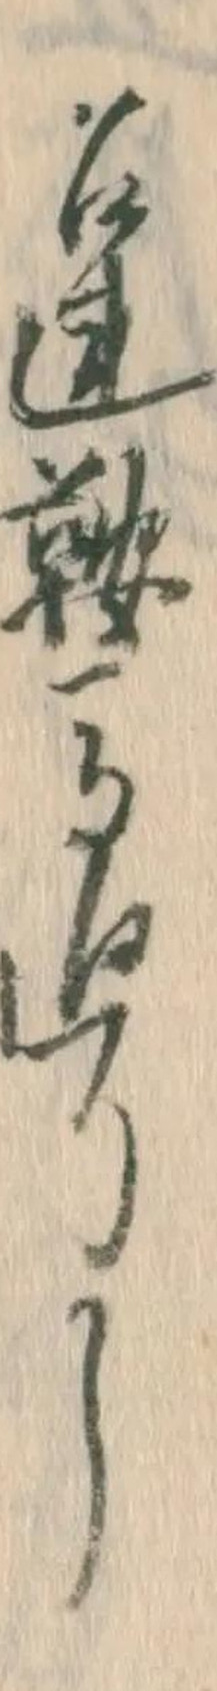召連鞍馬廻り了
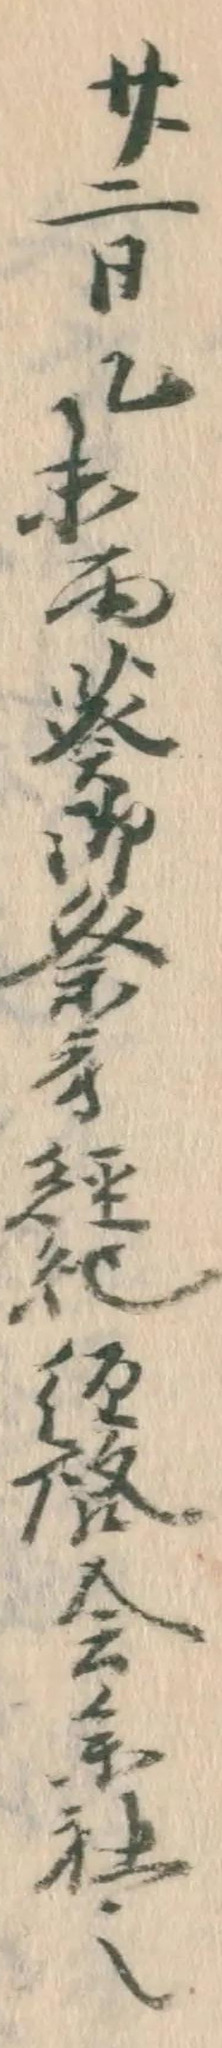廿二日乙未雨葵祭ニ付経紀経啓令参社也
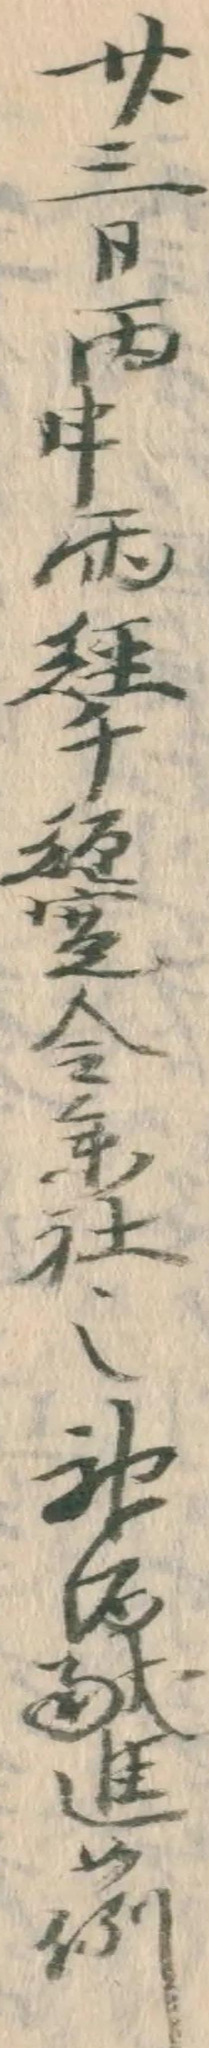廿三日丙申雨経千経寛令参社也神酒献進如例
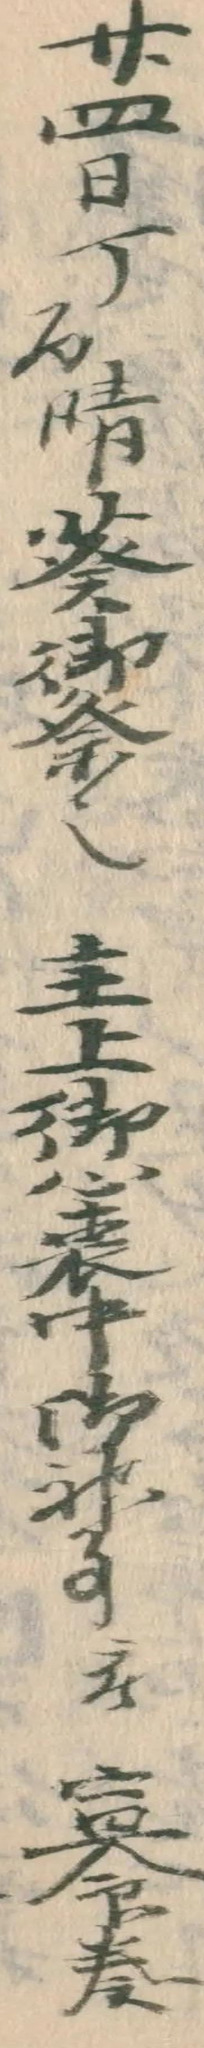廿四日丁酉晴葵御祭也主上御心喪中御神事ニ付宣命奏
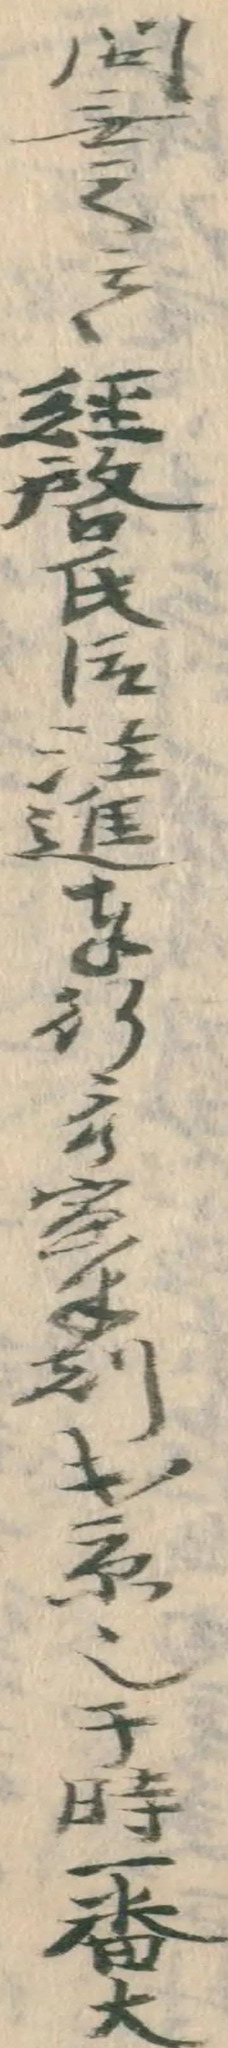聞無之云々経啓氏臣注進奉行ニ付寅半刻出京也于時一番大
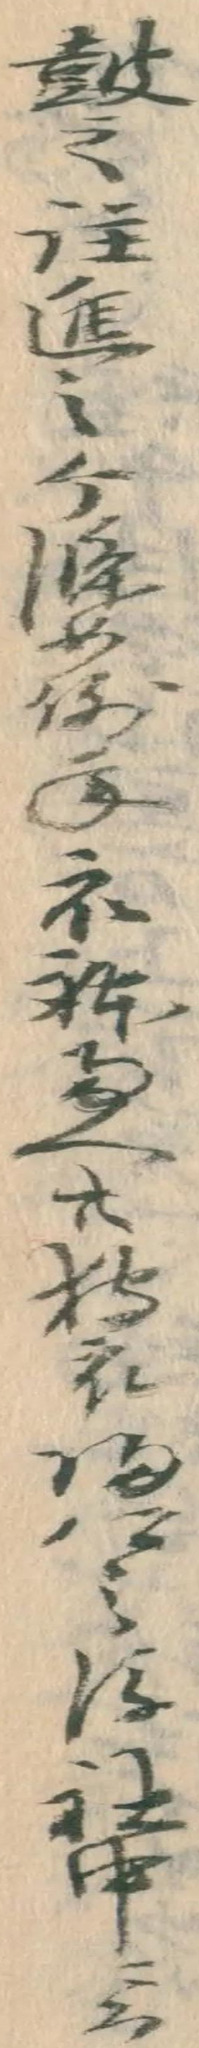皷之注進之分條如例年衣躰両人共狩衣帰郷之後社中二而

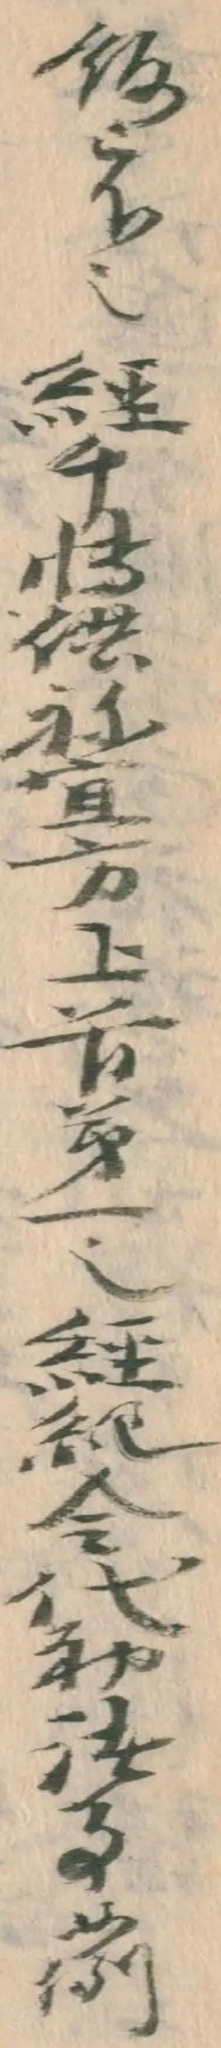飯被下也経千轉供祢宜方上首第一也経紀令代勤諸事如例
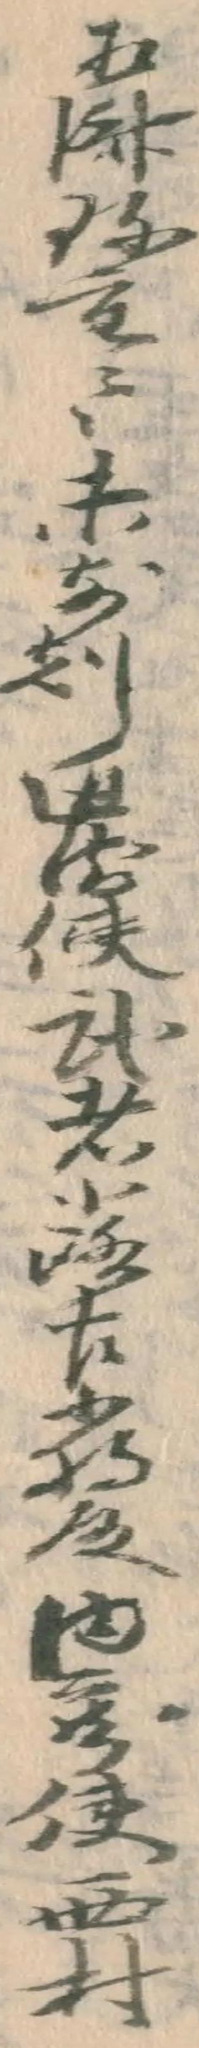相済珍重々々未前刻近衛使武者小路左小将殿内藤使西村
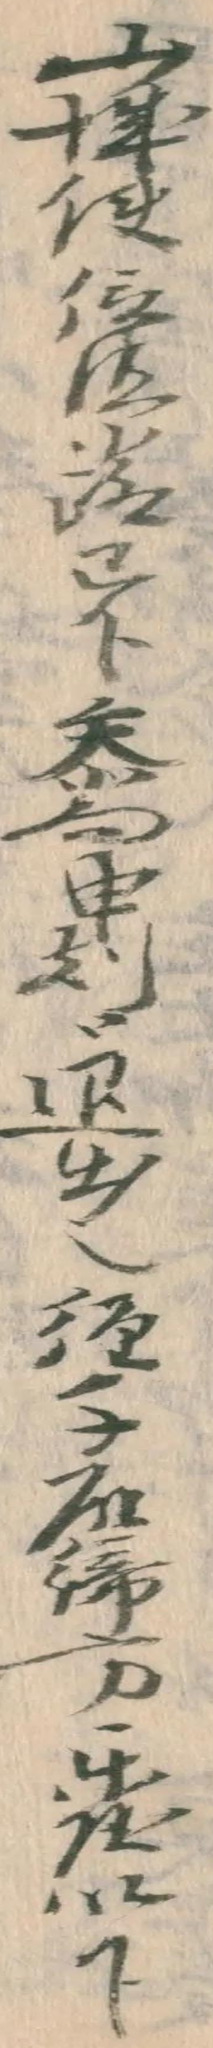山城使小路已下悉向申刻御退出也経千取締方へ出座以下
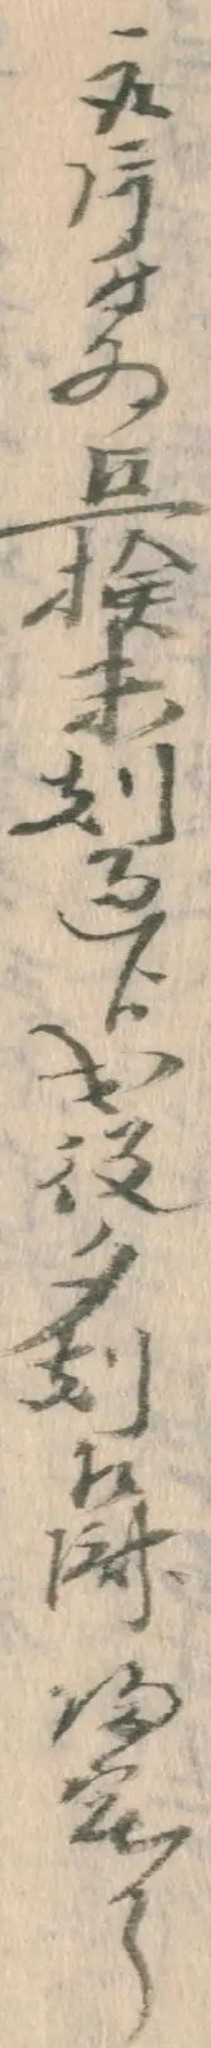取片付為且検未刻過ゟ出役夕刻相済帰宅了
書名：賀茂社記録. 第69冊
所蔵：国立国会図書館 National Diet Library, JAPAN
